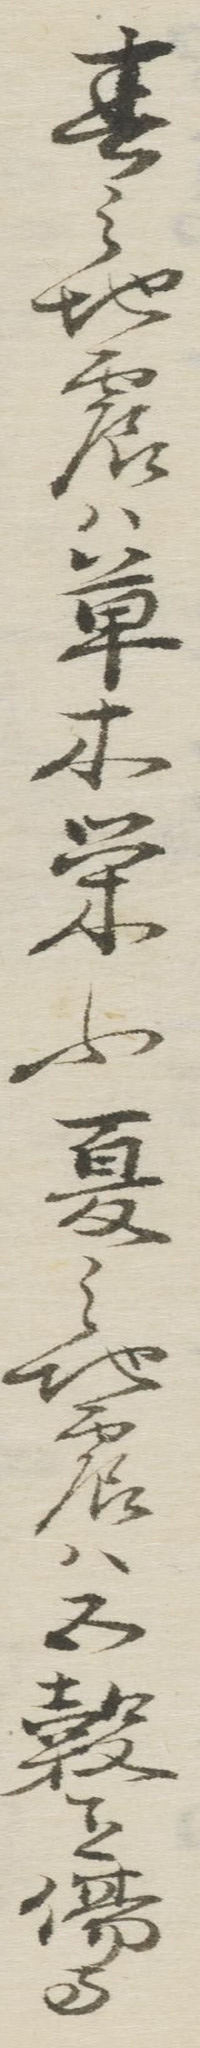春之地震ハ草木栄ふ夏之地震ハ五穀を傷る
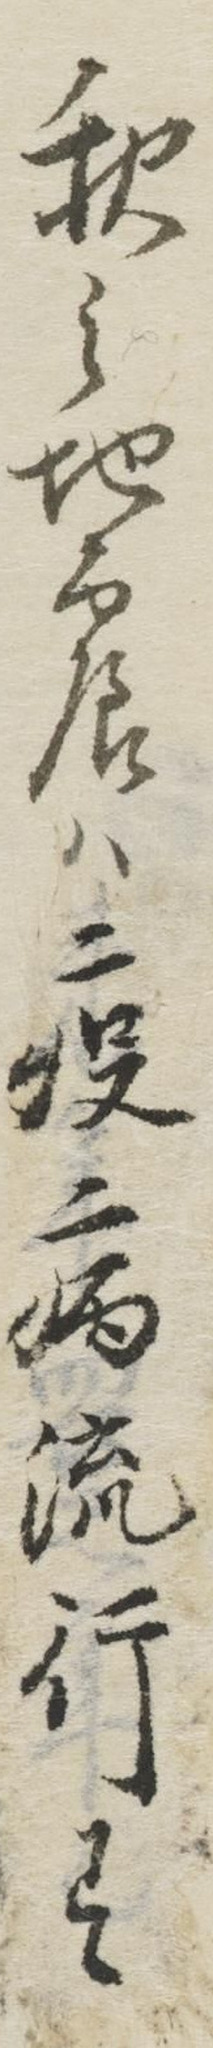秋之地震ハ疫病流行す
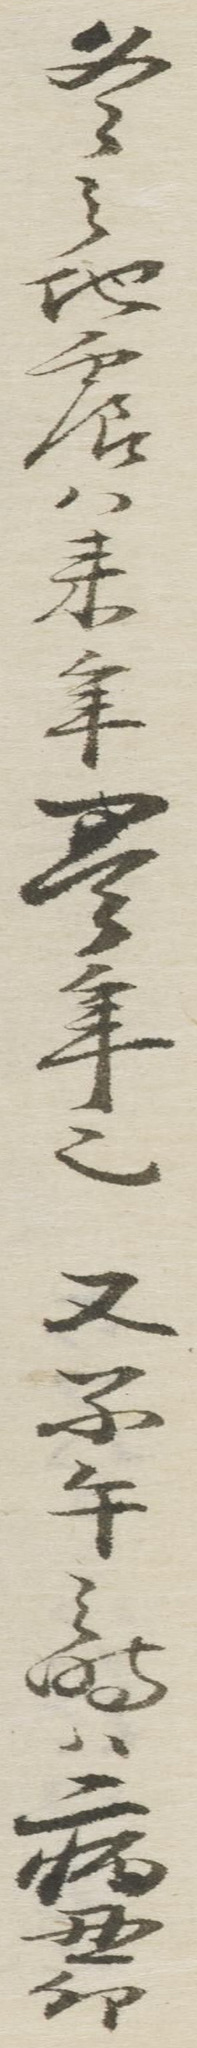冬之地震ハ来年豊年也又子午之時ハ病丑卯
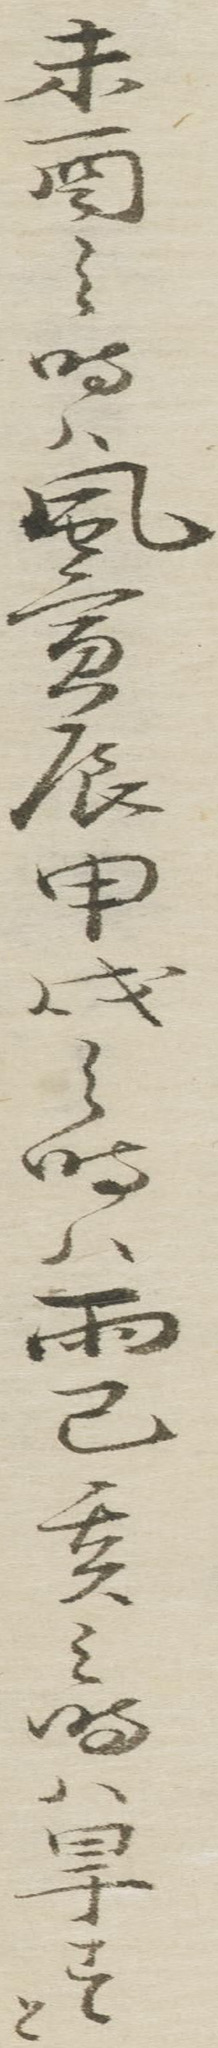未酉之時ハ風寅辰甲戍之時ハ雨己亥之時ハ旱すと

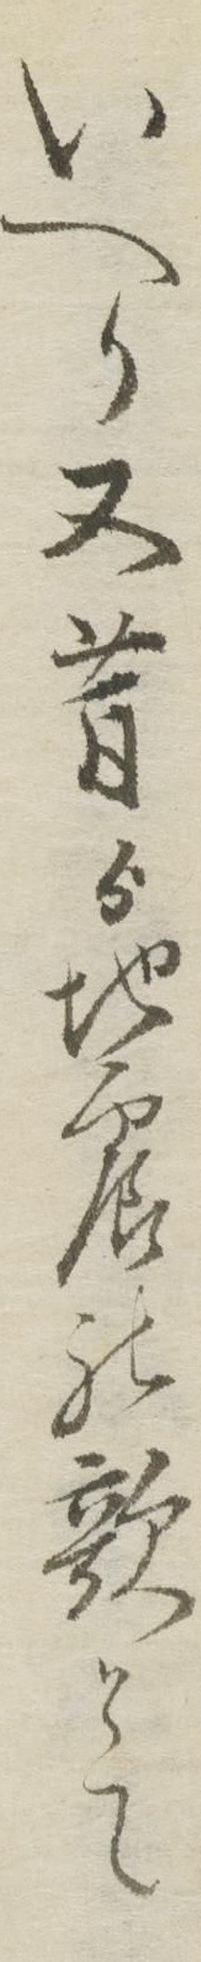いへり又昔ゟ地震之歌とて
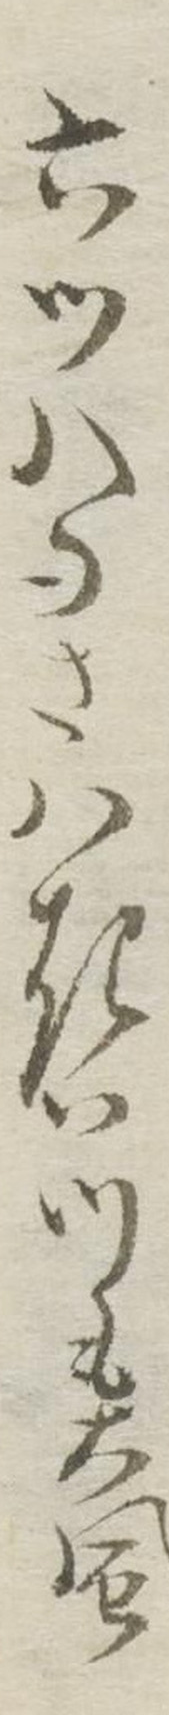六ツ八日さはきいつも大風
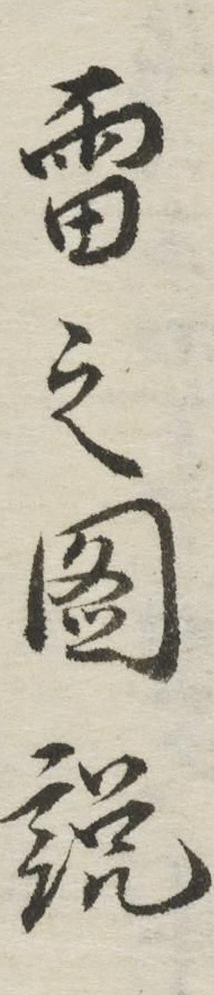雷之図説
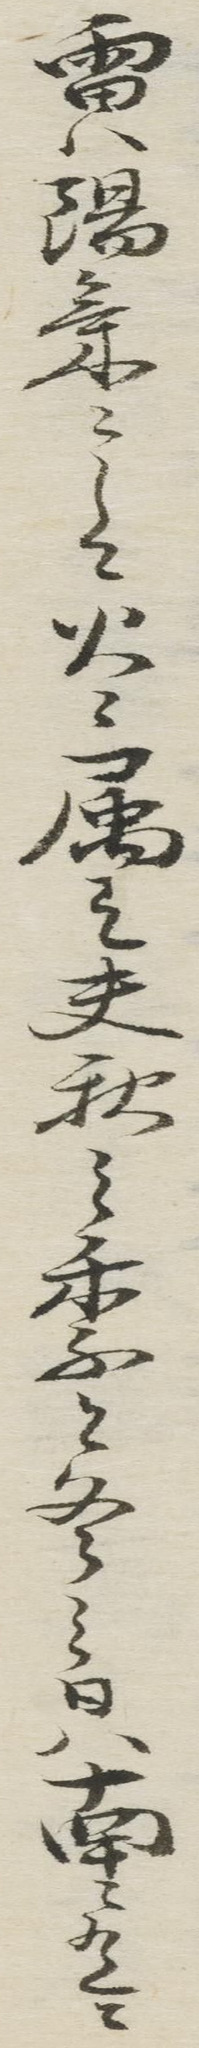雷ハ陽気ニして火ニ属す夫秋之季と冬之日ハ南ニ有て
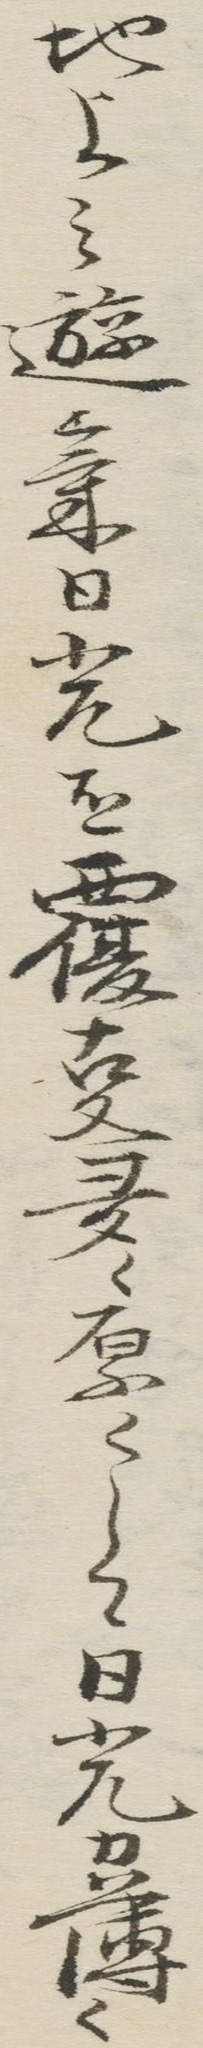地上之遊気日光を覆事多く厚くして日光カ薄く
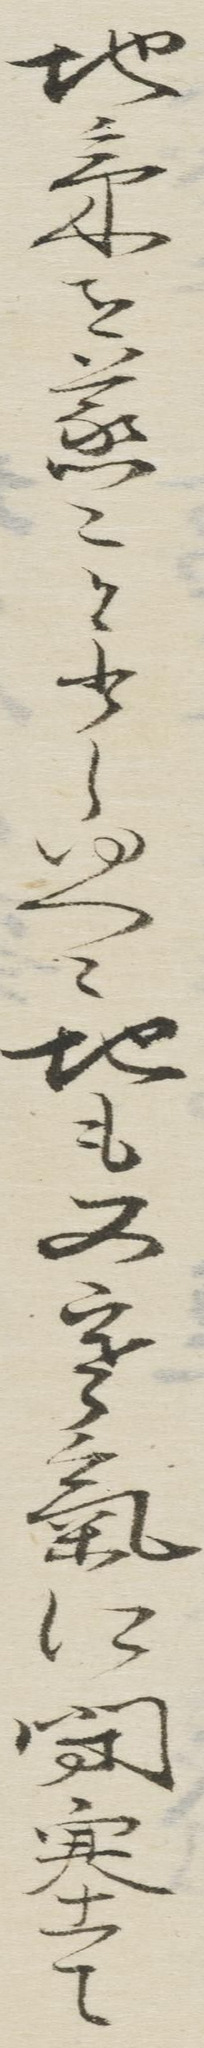地気を蒸こと少しゆへニ地も又寒気に閉塞て
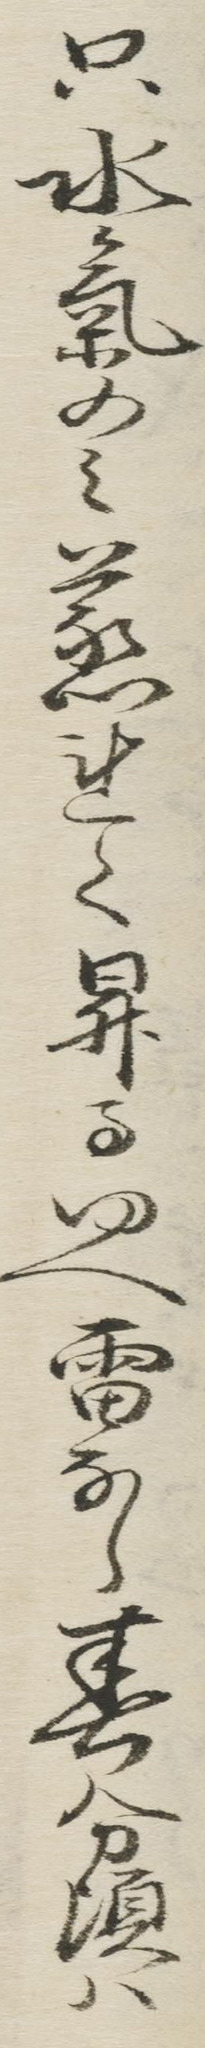只水気のみ蒸れて昇るゆへ雷なし春分頃ハ
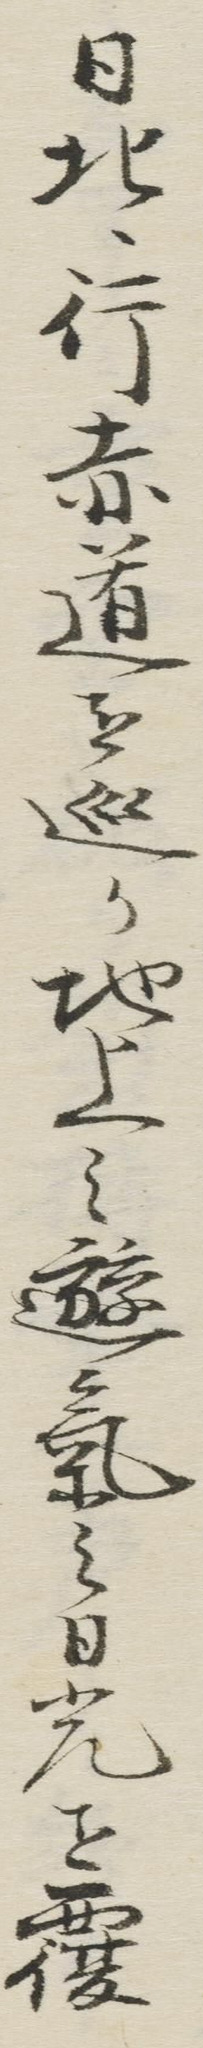日北へ行赤道を巡り地上之遊気之日光を覆
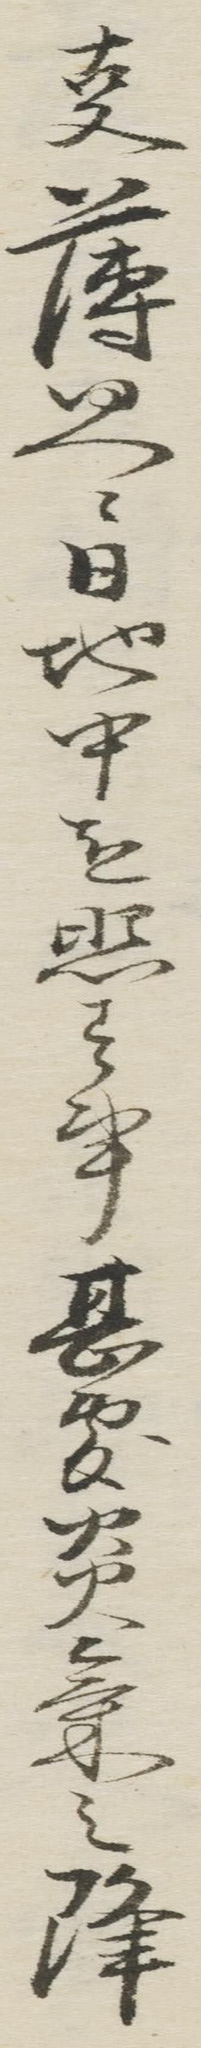事薄ゆへニ日地中を照す事甚敷炎気之降
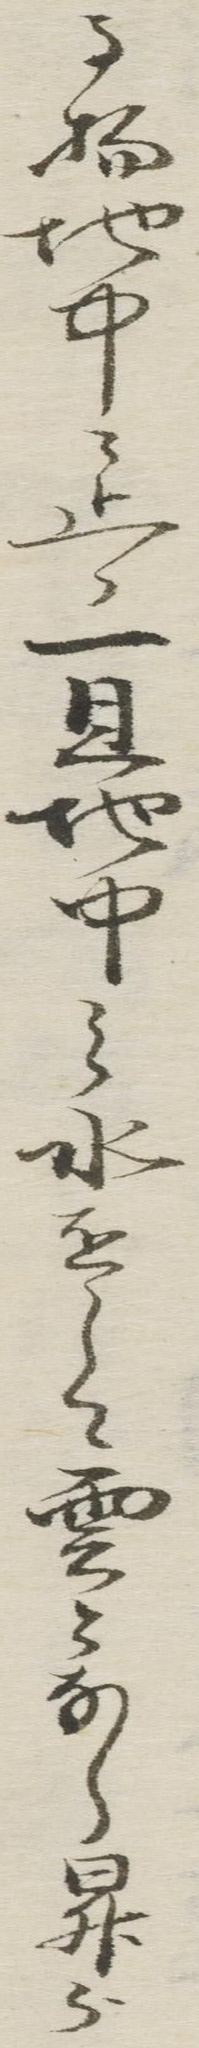る物地中ニ止り一旦地中之水をして雲となし昇ら
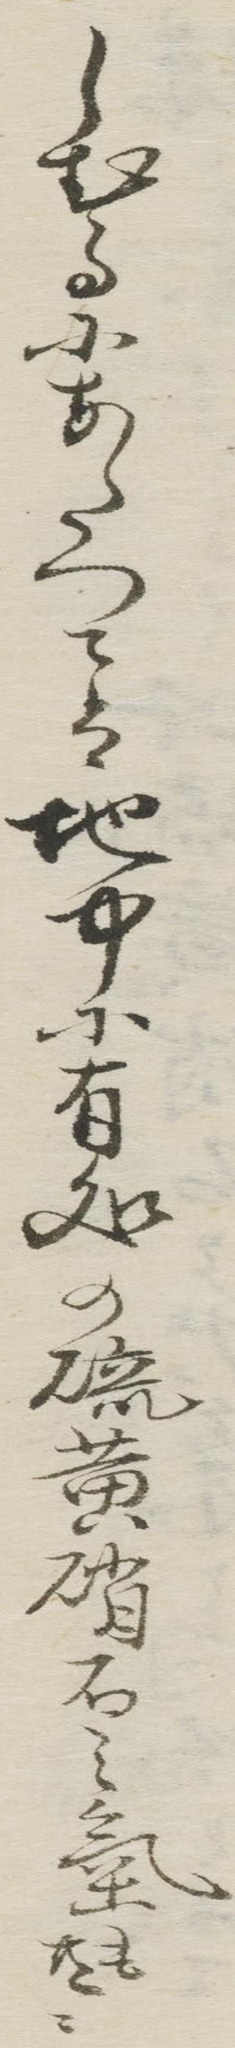しむるにあたつては地中に有処の硫黄硝石之気も共ニ
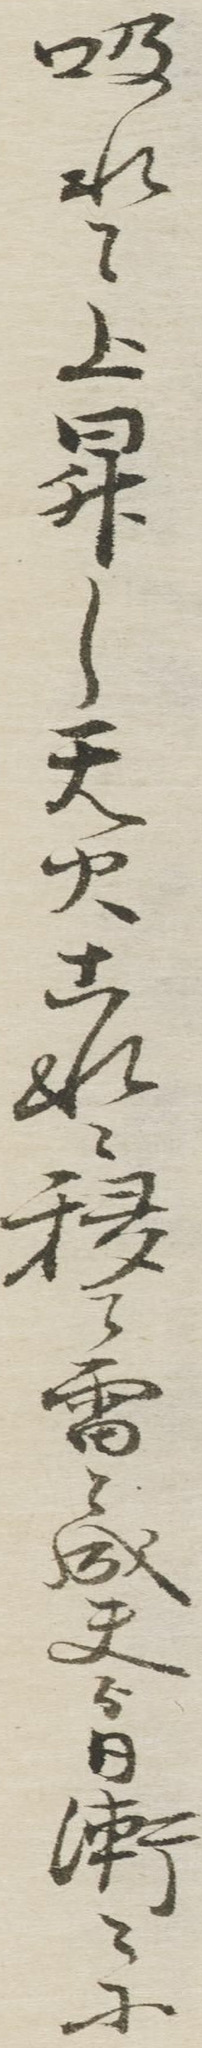吸れて上昇し天火これニ移て雷と成夫ゟ日漸々に
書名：諸国大地震大津波一代記
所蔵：東京大学地震研究所図書室 Earthquake Research Institute Library, The University of Tokyo, JAPAN
